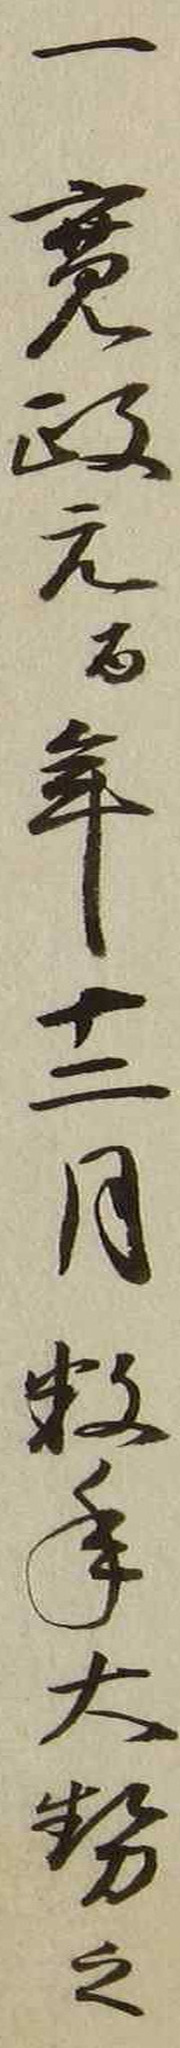一寛政元酉年十二月数年大勢之
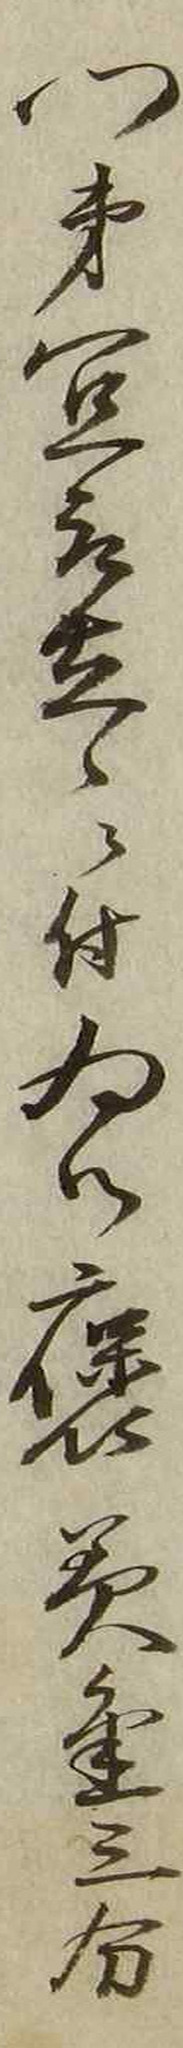門弟宜取立候ニ付為御褒美金三分
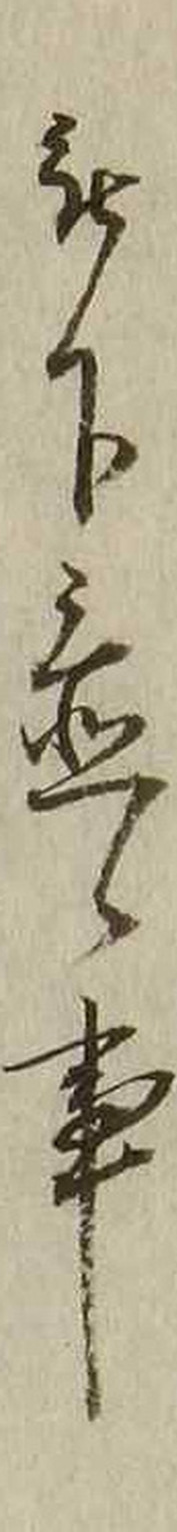被下置候事
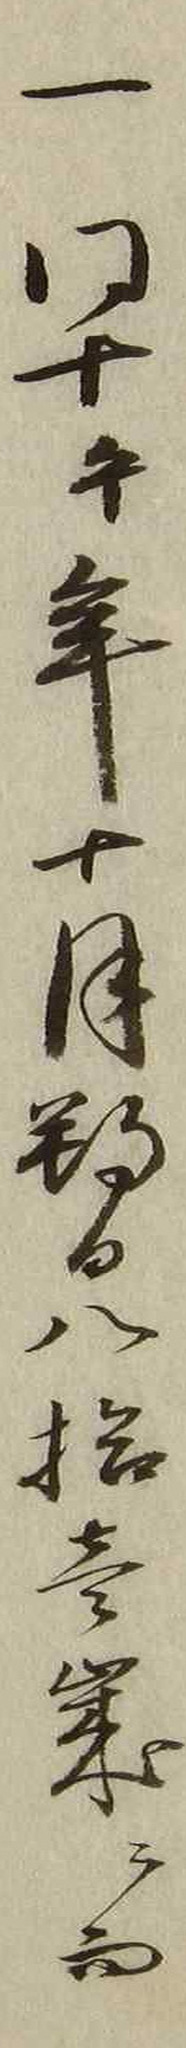一同十午年十月朔日八拾壱歳ニ而
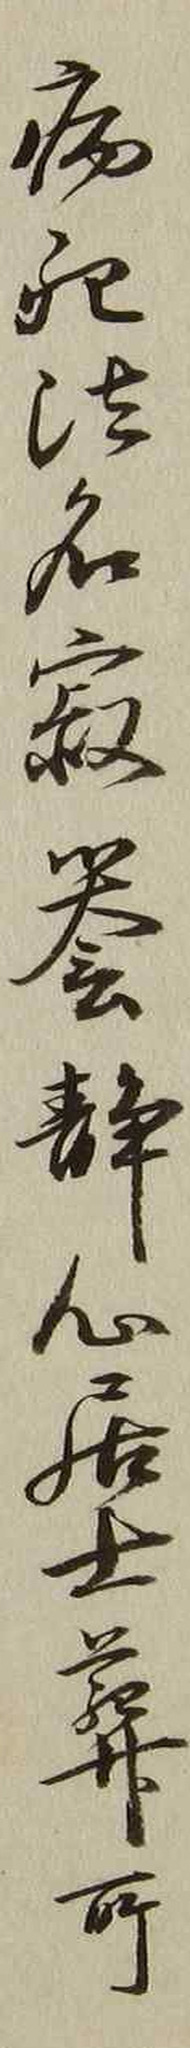病死法名寂誉静心居士葬所
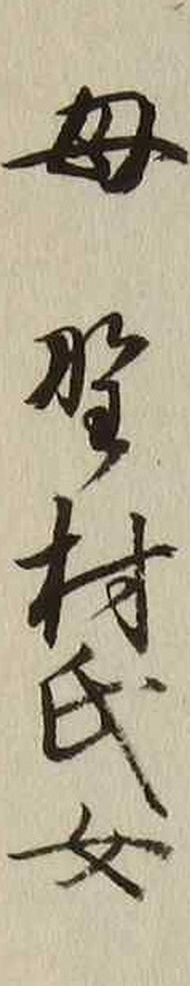母野村氏女
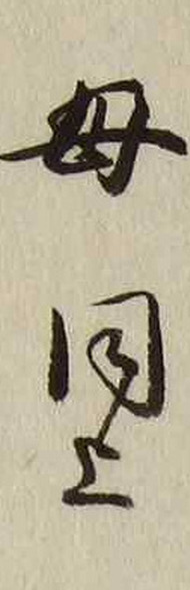母同上
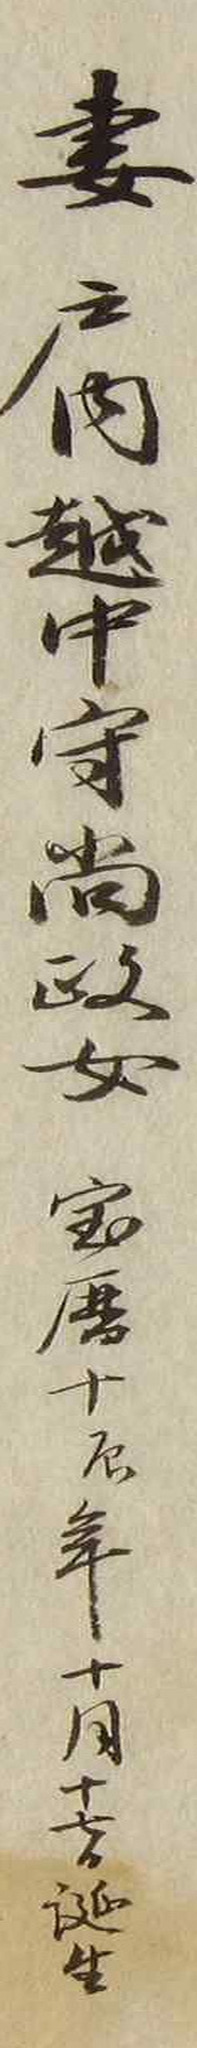妻戸内越中守尚政女宝暦十辰年十月十七日誕生
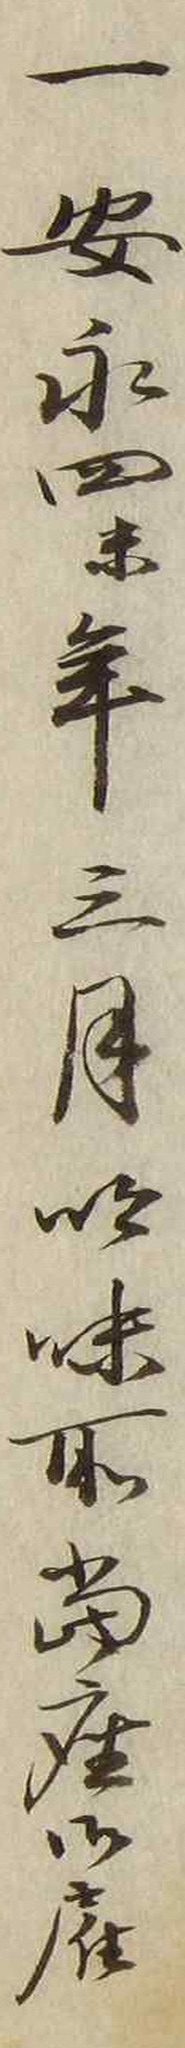一安永四未年三月吟味所当座御雇

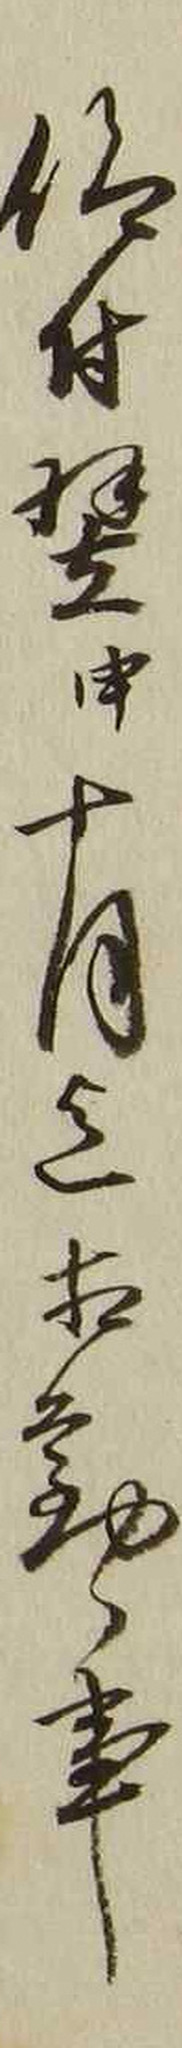被仰付翌申十月迄相勤候事
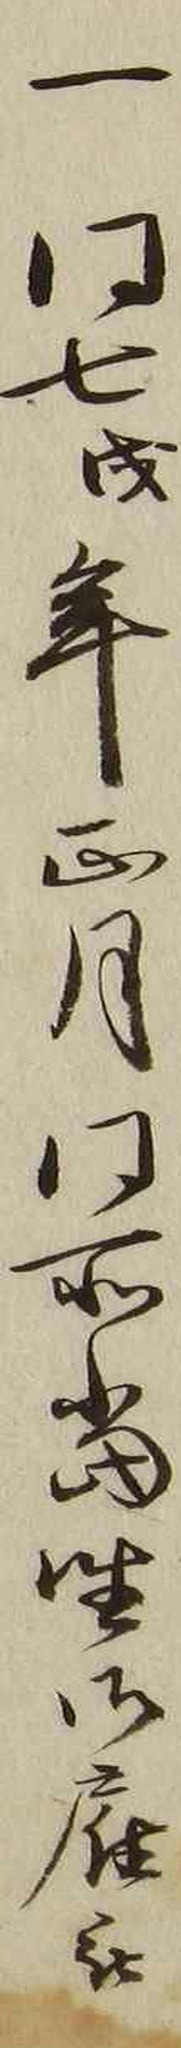一同七戌年正月同所当坐御雇被
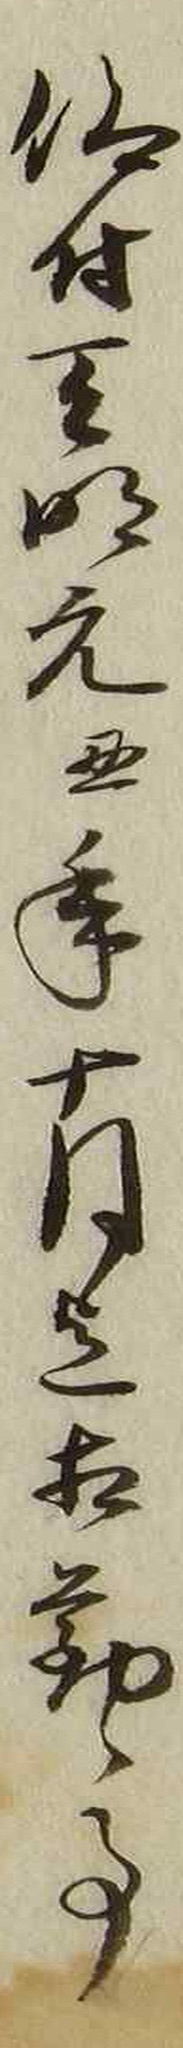仰付天明元丑年十月迄相勤候事
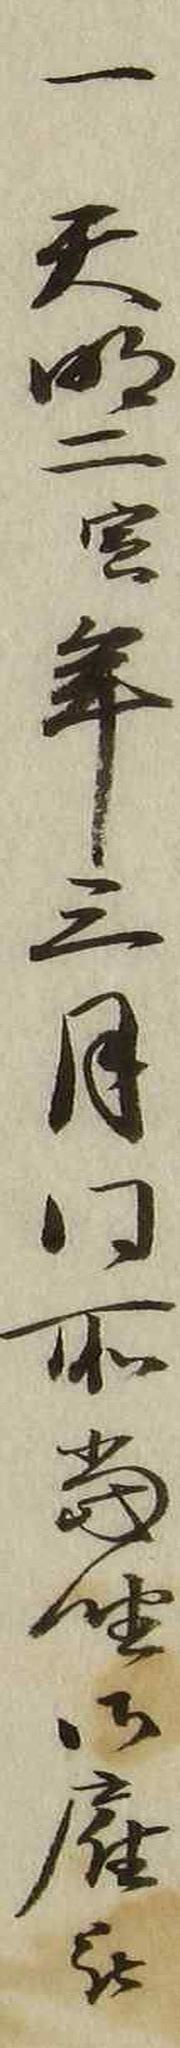一天明二寅年三月同所当坐御雇被
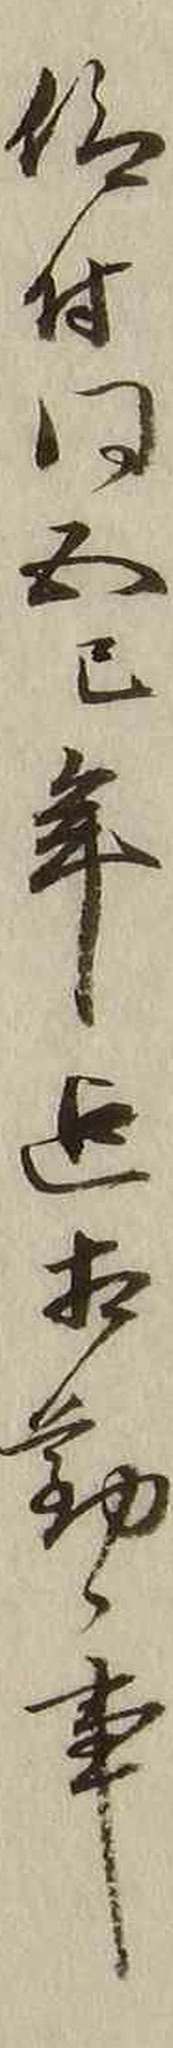仰付同五巳年迄相勤候事
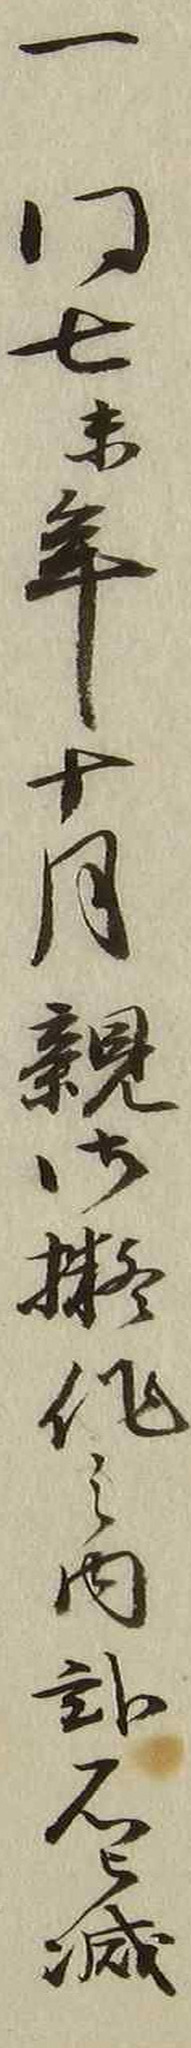一同七未年十月親御擬作之内弐石被減
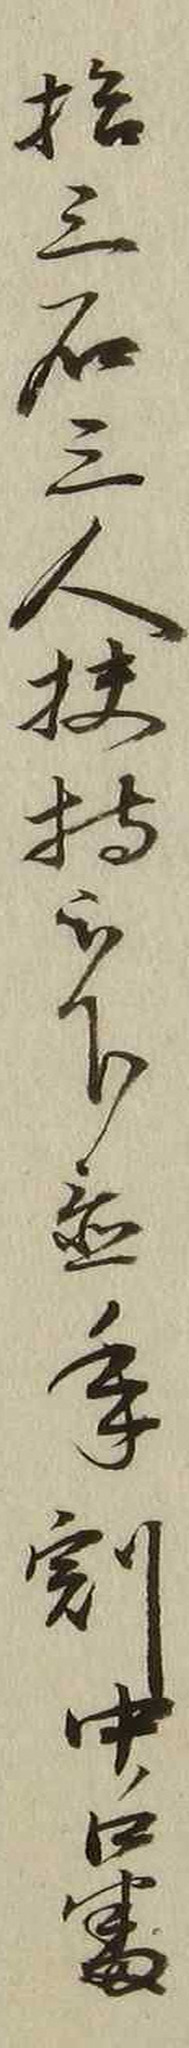拾三石三人扶持被下置年割中ノ口番
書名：諸士系譜　巻之102　か之部10
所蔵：会津若松市立会津図書館
